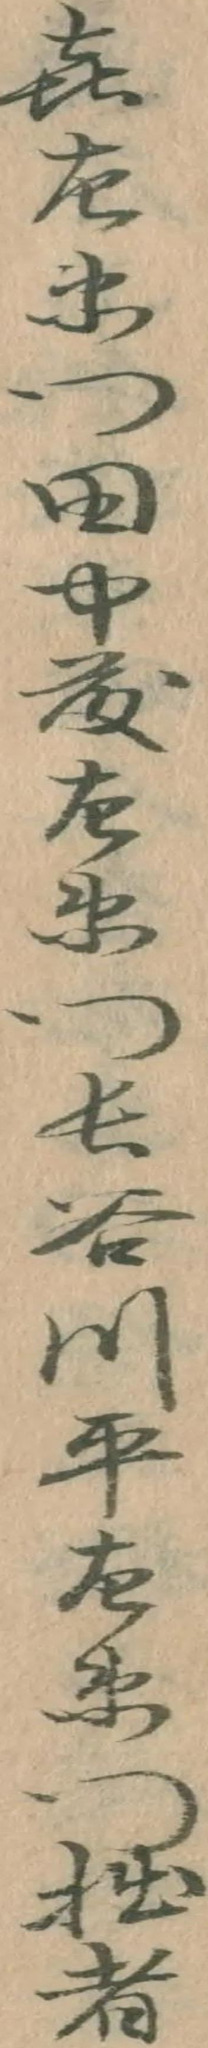喜左京衛門田中藤左衛門長谷川平左衛門拙者

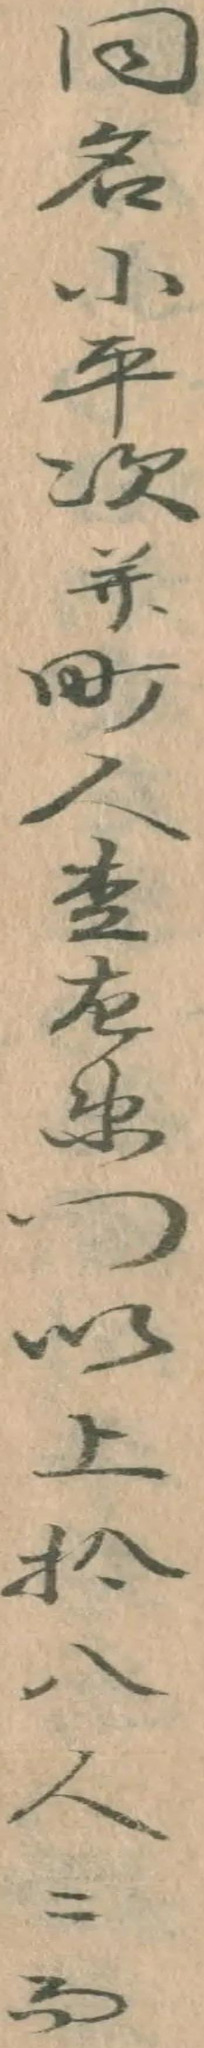同名小平次并町人無杢左衛門以上拾八人に而
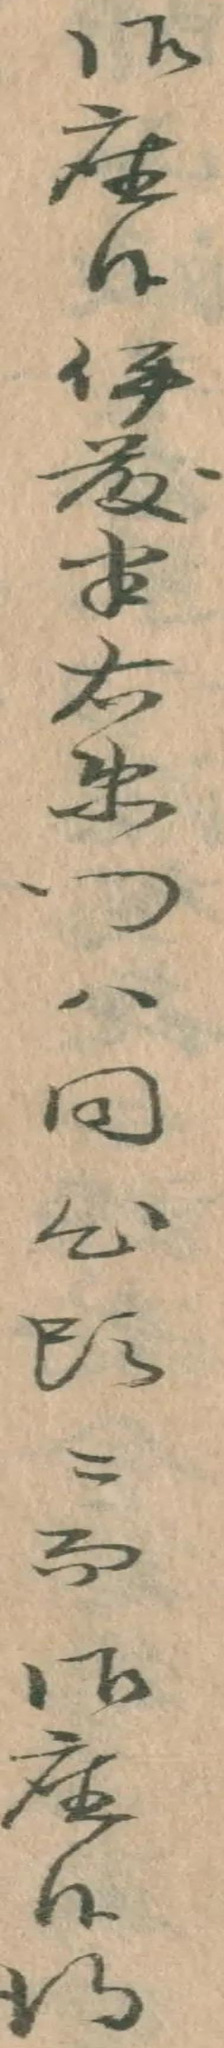御座候伊藤半右衛門は同心頭に而御座候得
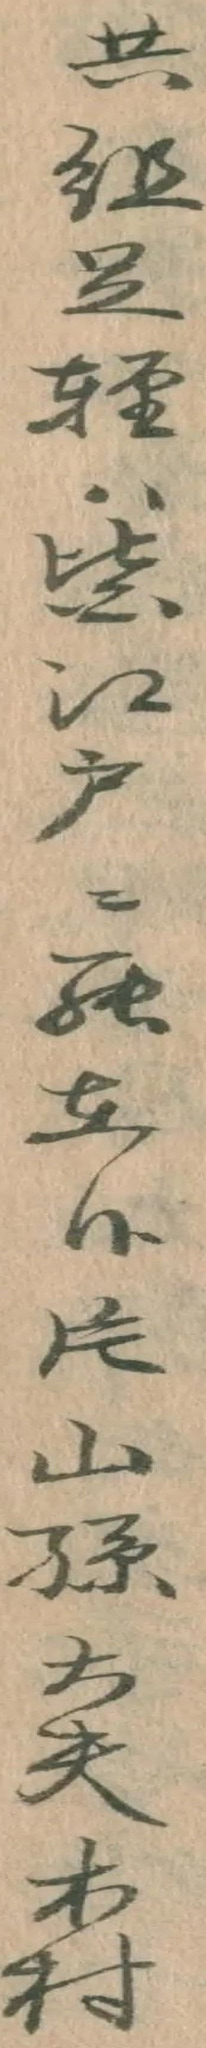共組足軽は皆江戸に罷在候片山孫大夫木村
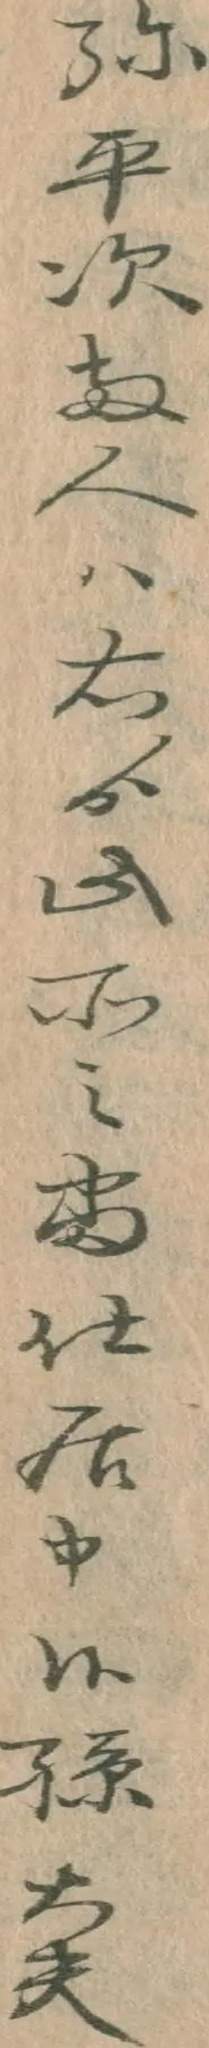弥平次両人は右ゟ此所之番仕居申候孫大夫
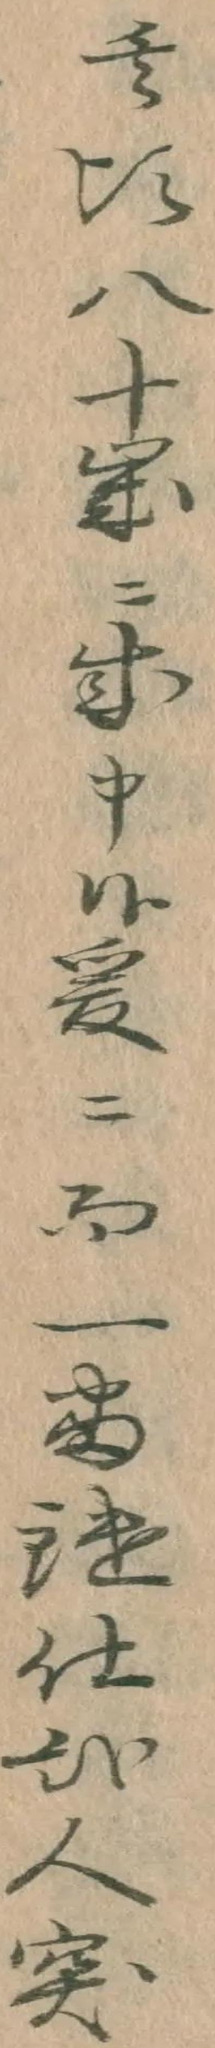其頃八十歳に成申候爰に而一番鑓仕弐人突
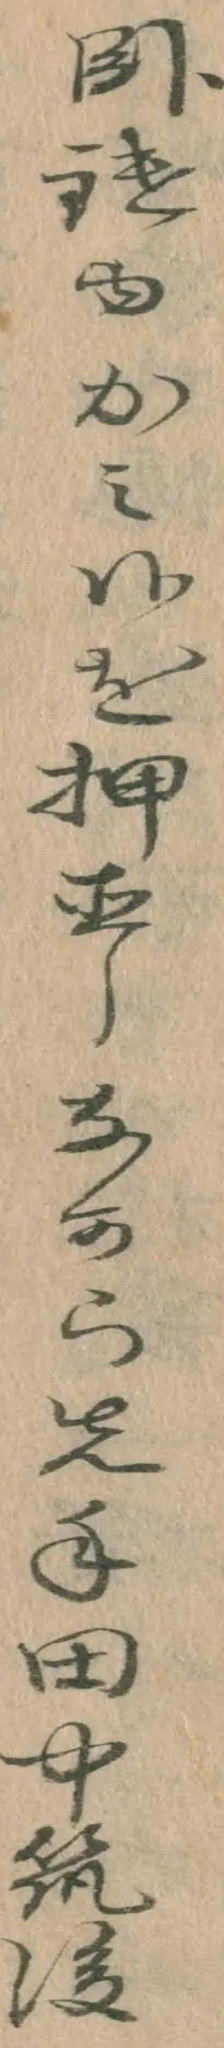臥鑓ゆかみ候を押直しなから先手田中筑後
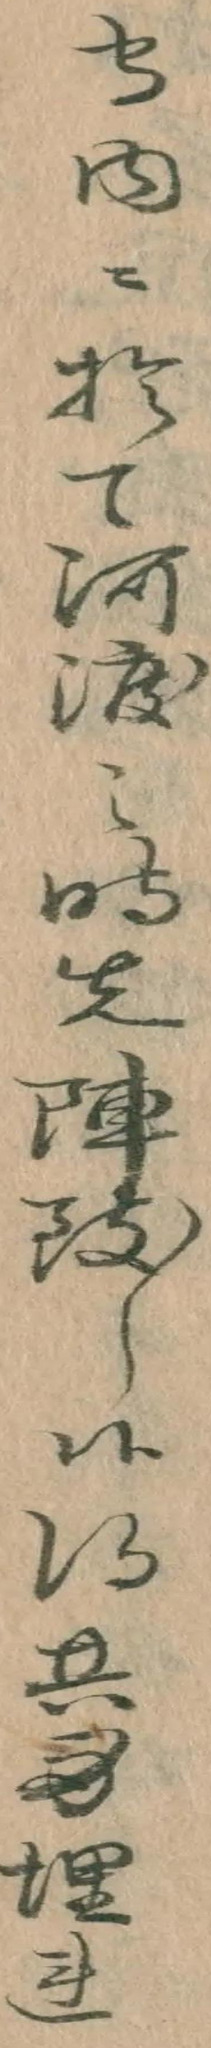守内に於て河渡之時先陣致し候得共身埋れ
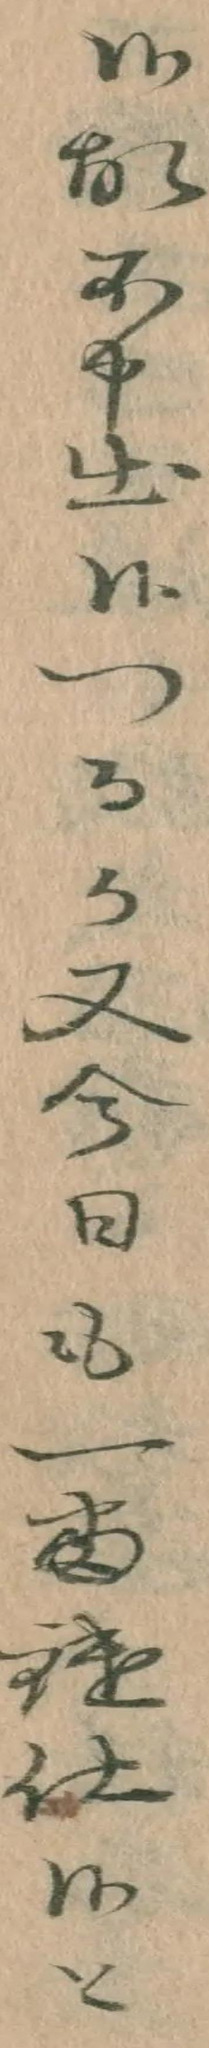候故不申出候つるか又今日も一番鑓仕候と
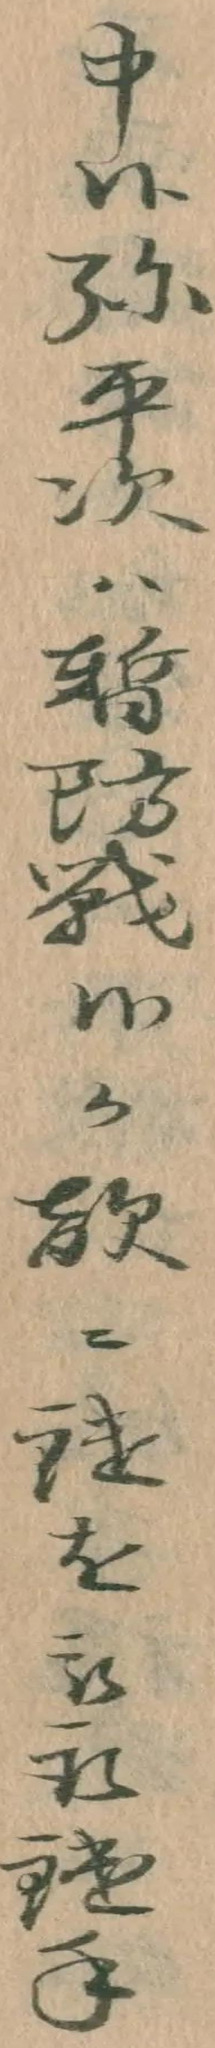申候弥平次は暫防戦候か敵に鑓を被取鑓手
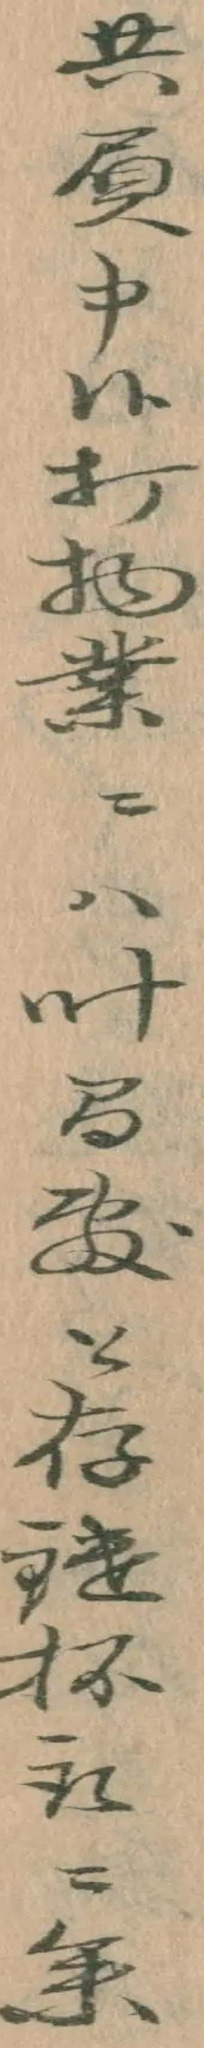共負申候打物業には叶間敷と存鑓坏取に参
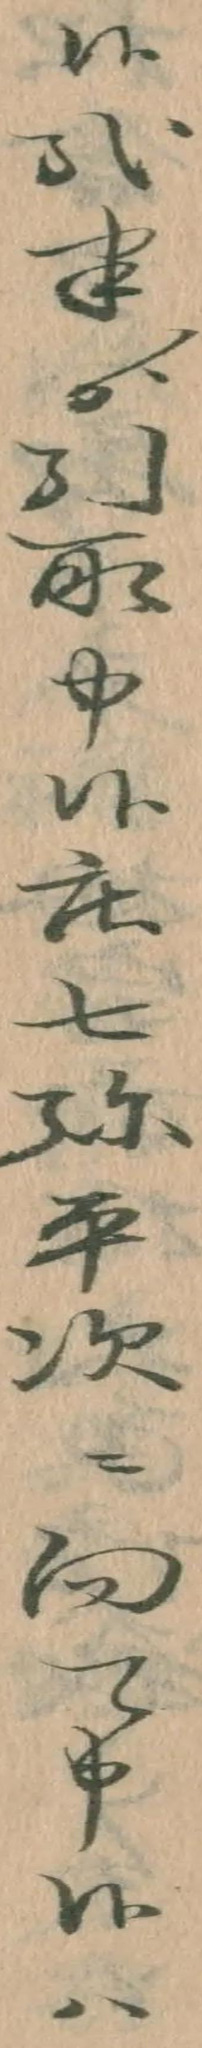候哉半ゟ引取申候庄七弥平次に向て申候は
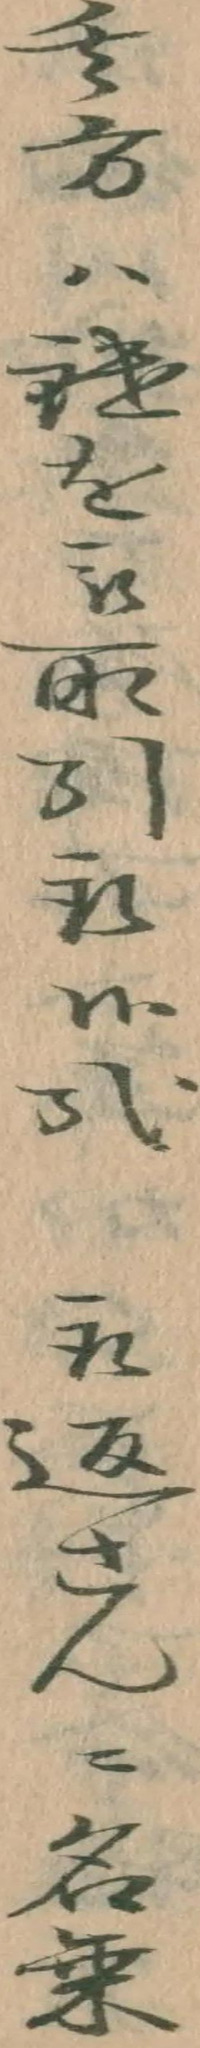其方は鑓を被取引取候哉取返さんに名乗
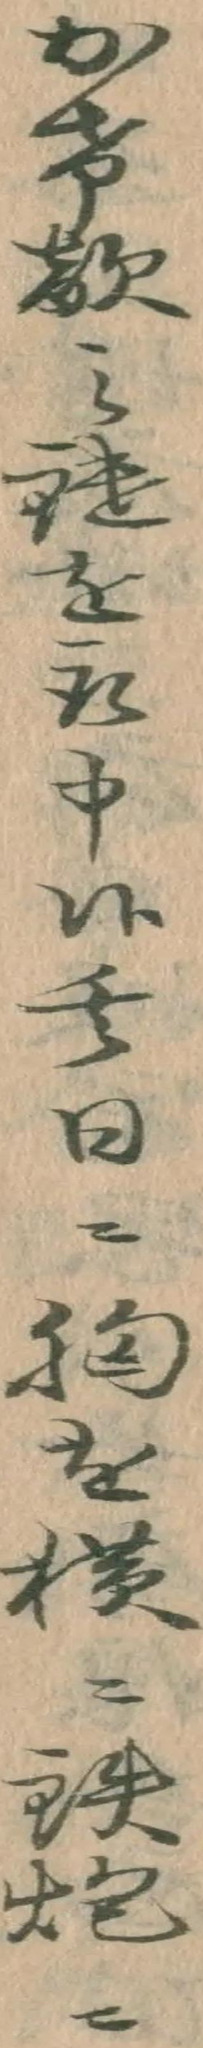かけ敵之鎗を取申候其日に胸を横に鉄炮に
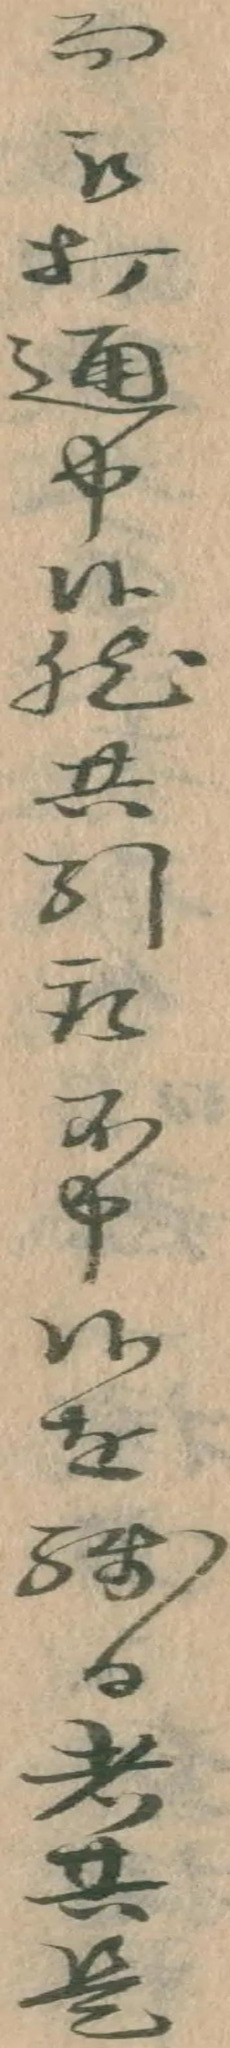而被打通申候然共引取不申候を残る者共是
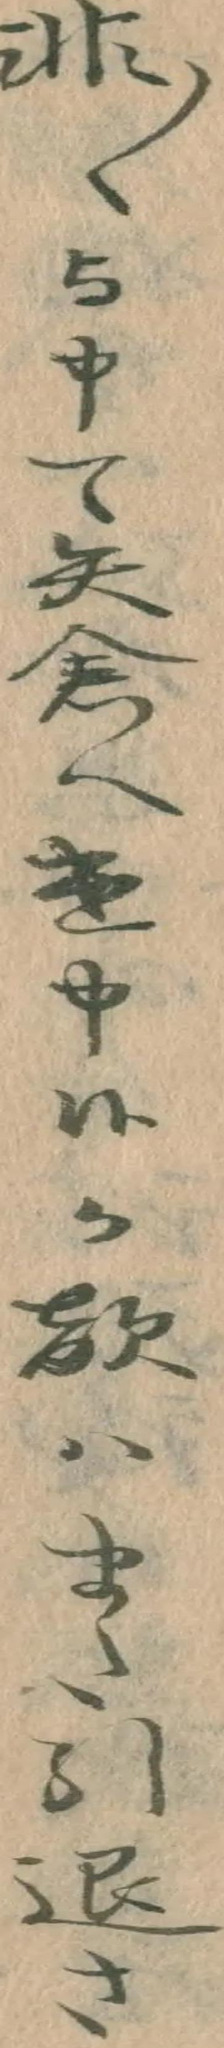非〱与申て矢倉へ遣申候か敵はまた引退さ
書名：切支丹御退治記 49巻. [1]
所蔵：国立国会図書館 National Diet Library, JAPAN
